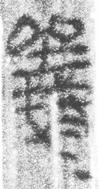襄（囊）
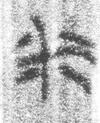米
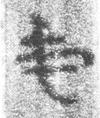屯
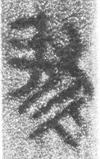緅
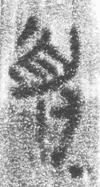{巾首}
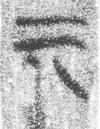亓（其）
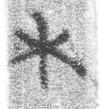木
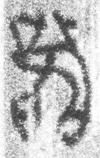器
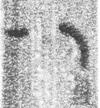一
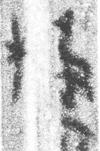○（橛）
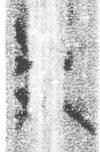厀（漆）
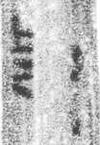彫（雕）
